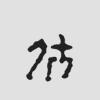居
